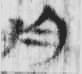舟
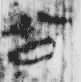公
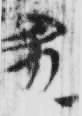豕
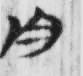舟
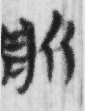斨
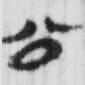公
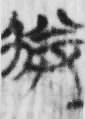劵
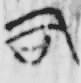司
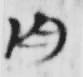舟
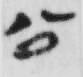公
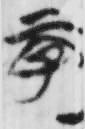○（娩）
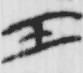壬
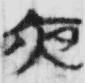○（夜）
